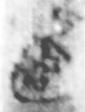○（箙）
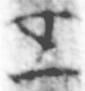五
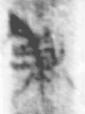秉
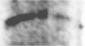一
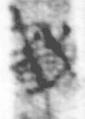載
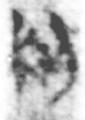紫
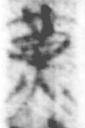黃
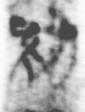紡
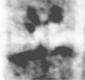之
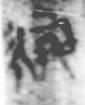綳
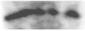一
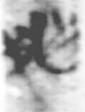○（戟）
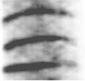三
